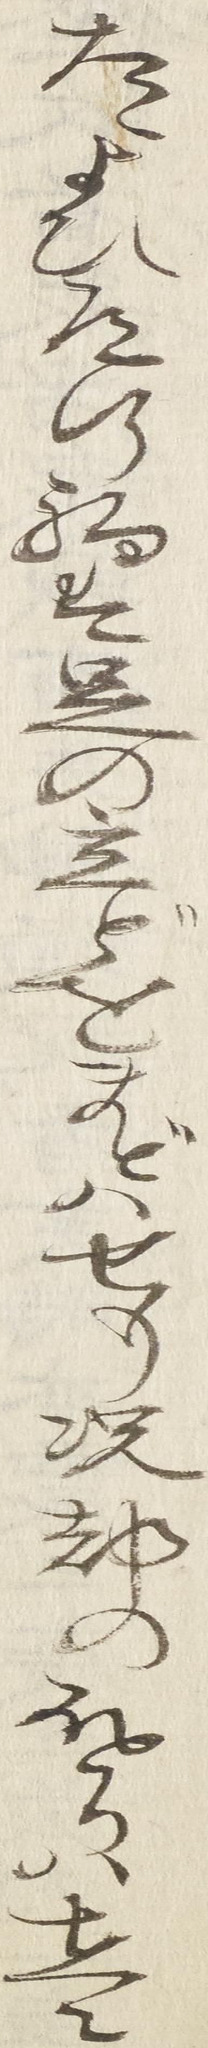たゝよひ道行駒は足の立どをまどはせり況都のほとりは在々
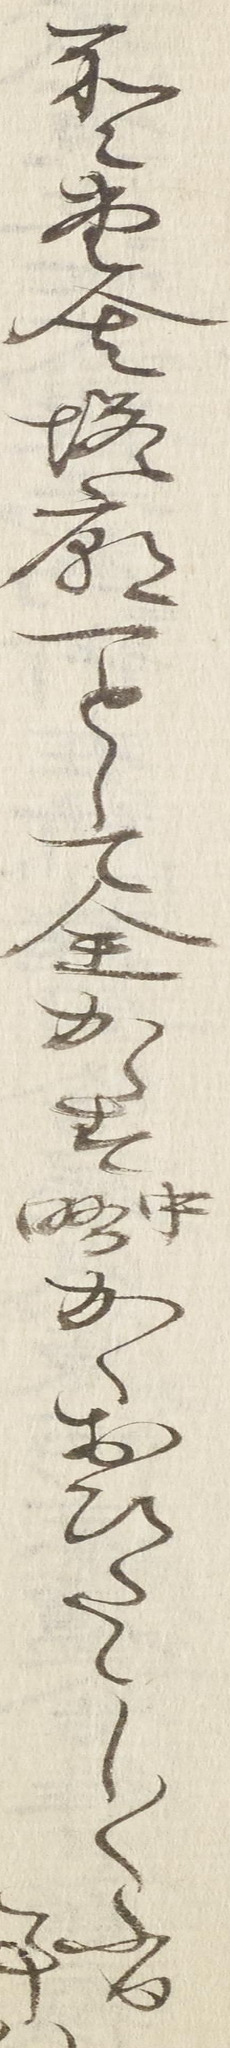所々堂舎塔廊一として全からす中略かくおひたゝしくふる事は
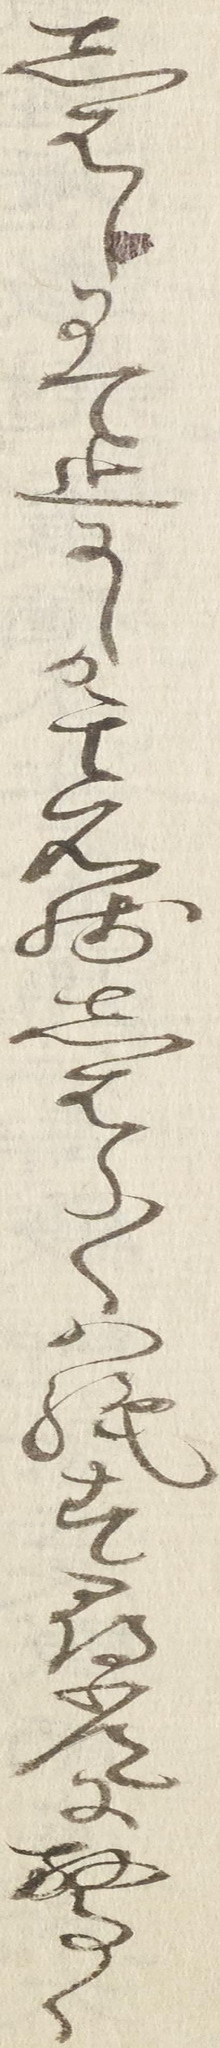しはしにて止にしか其名残しはらくは絶す尋常に驚く
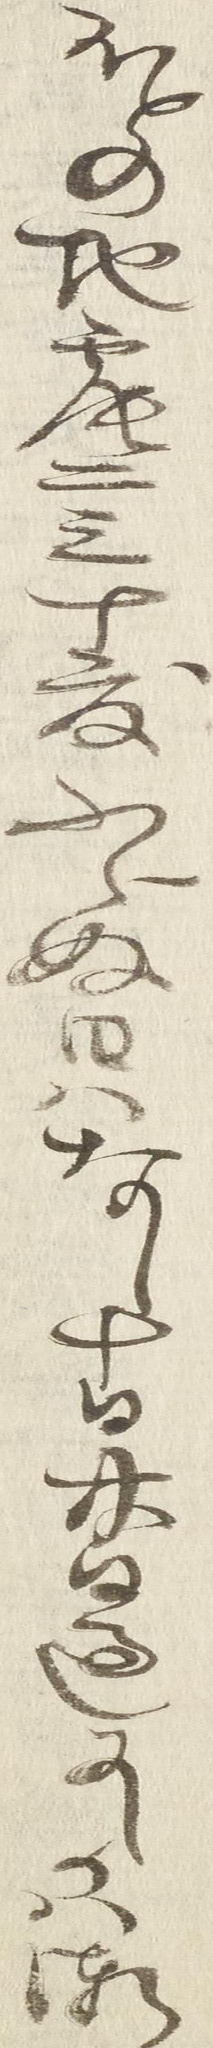ほとの地震二三十度ゆらぬ日はなし十日廿日過にしかは漸
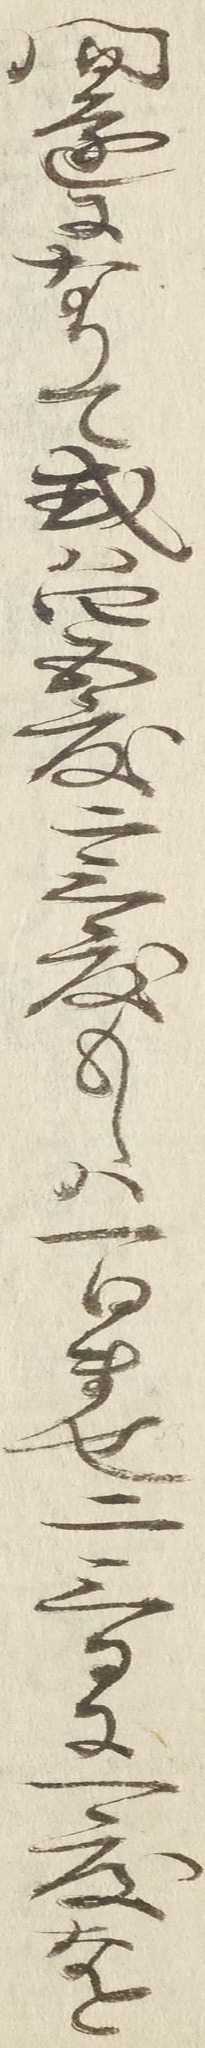間遠になりて或は四五度二三度もしは一日ませ二三日に一度なと
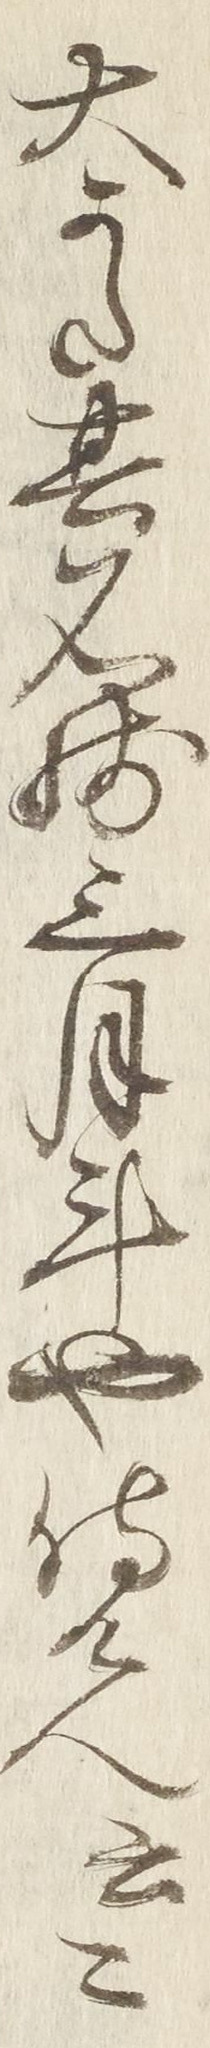大かた其名残三月斗也伝けん云々
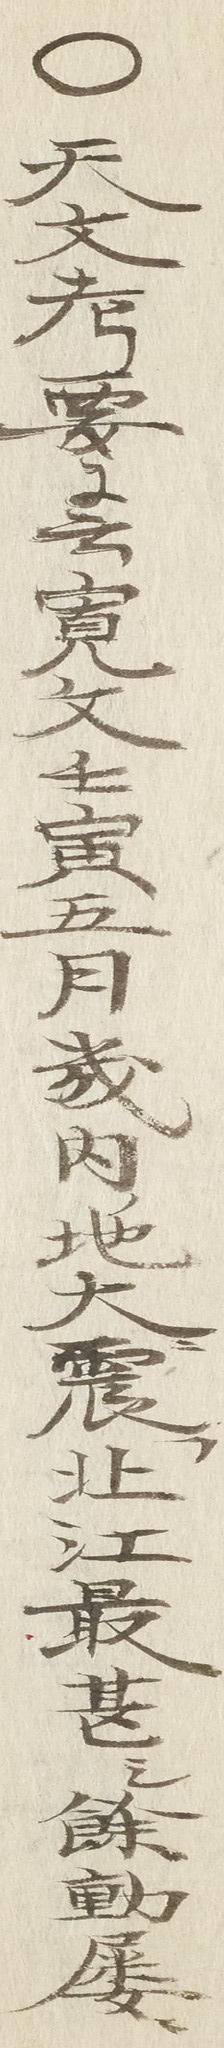〇天文考要に云寛文七壬寅五月畿内の地大に震ふ北江最甚し餘動屡に
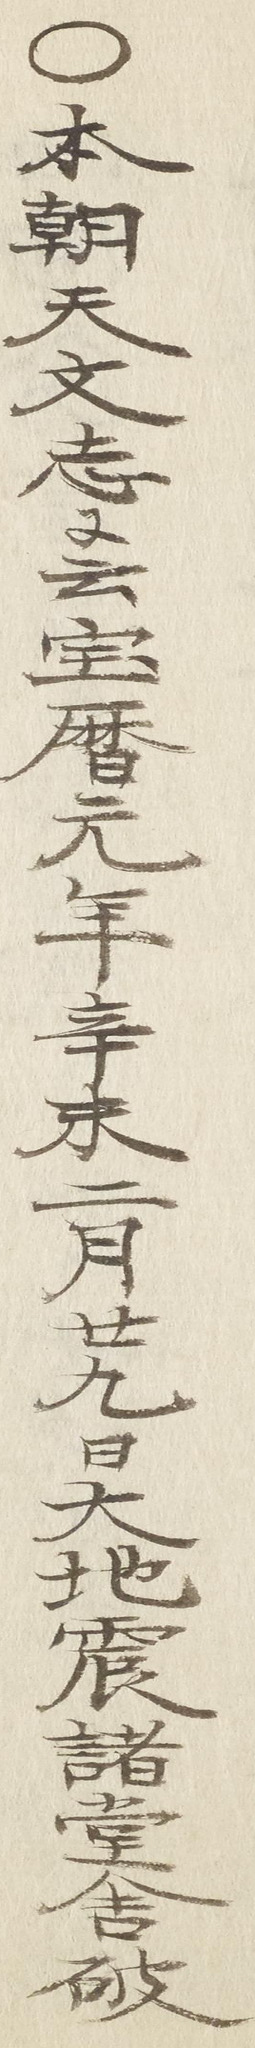〇本朝天文志に云宝暦元年辛未二月廿九日大地震諸堂舎破
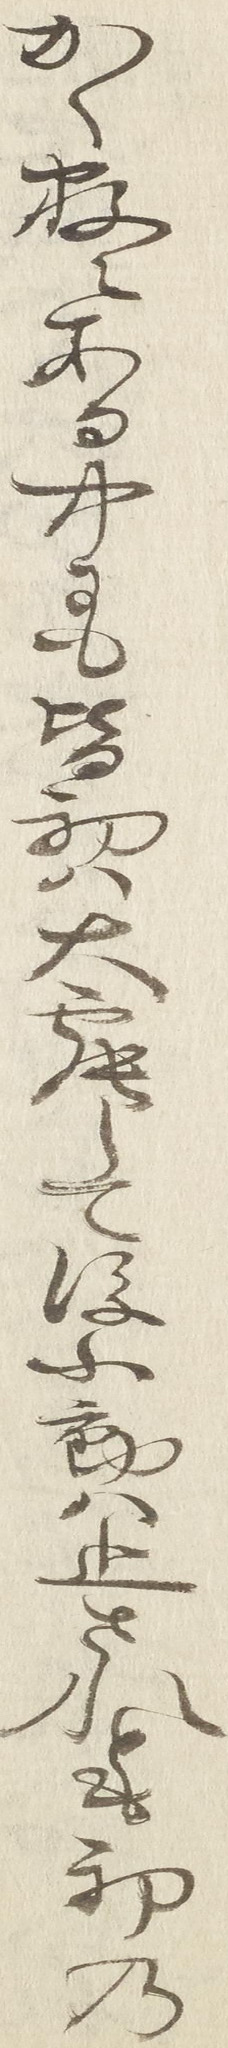かく数々ある中にも皆初は大震して後小動は止されとも初の
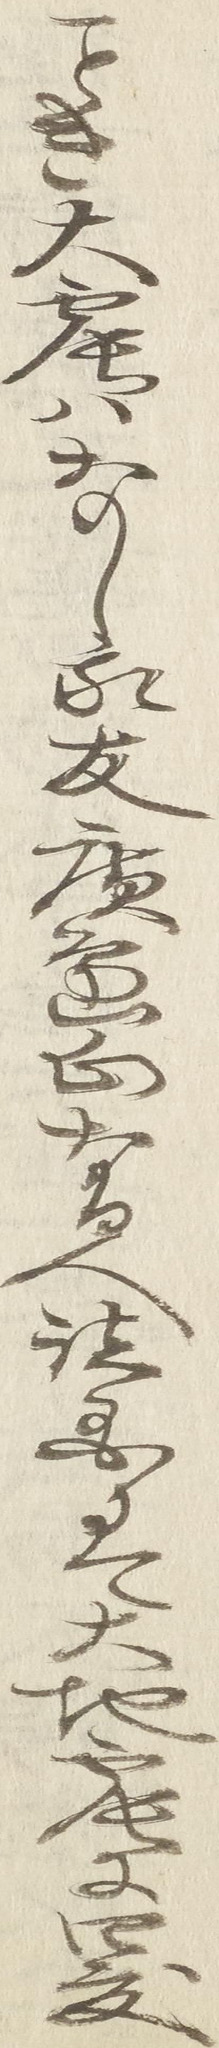ことき大震はなし我友広島正なる人諸国にて大地震に四度
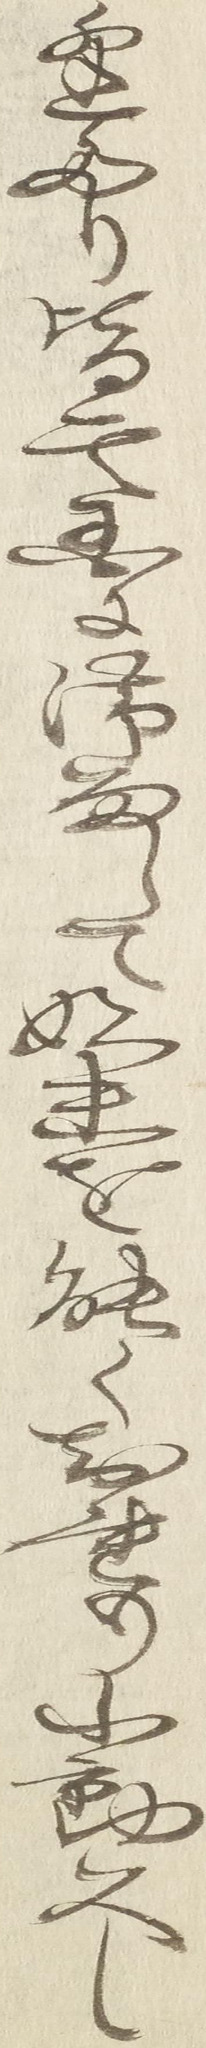逢たり皆其国に滞留して始末を能く知れり小動舊久し
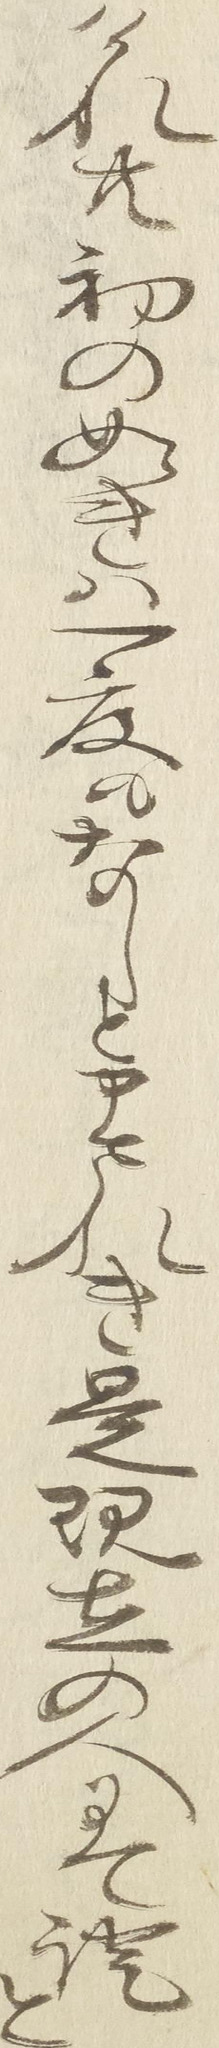けれ共初の如きは一度もなしと申されき是現在の人にて証と

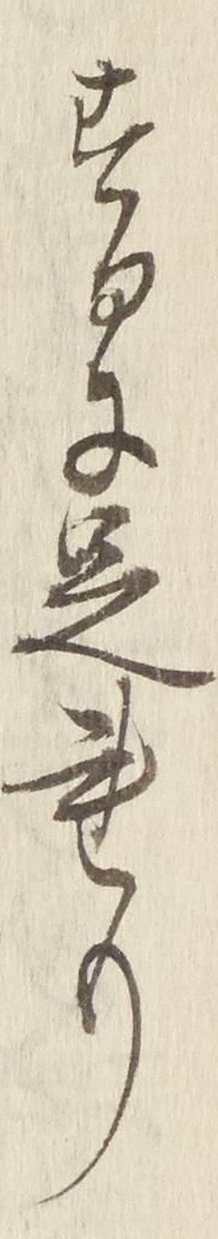するに足れり
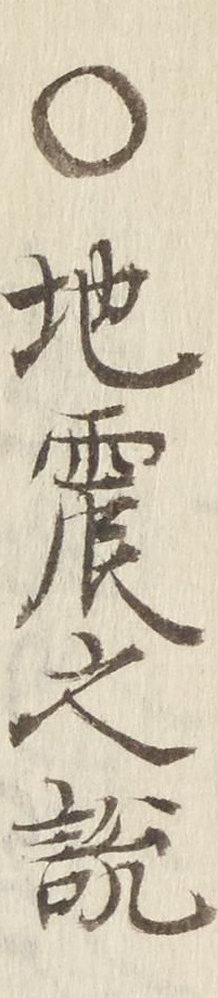〇地震之説
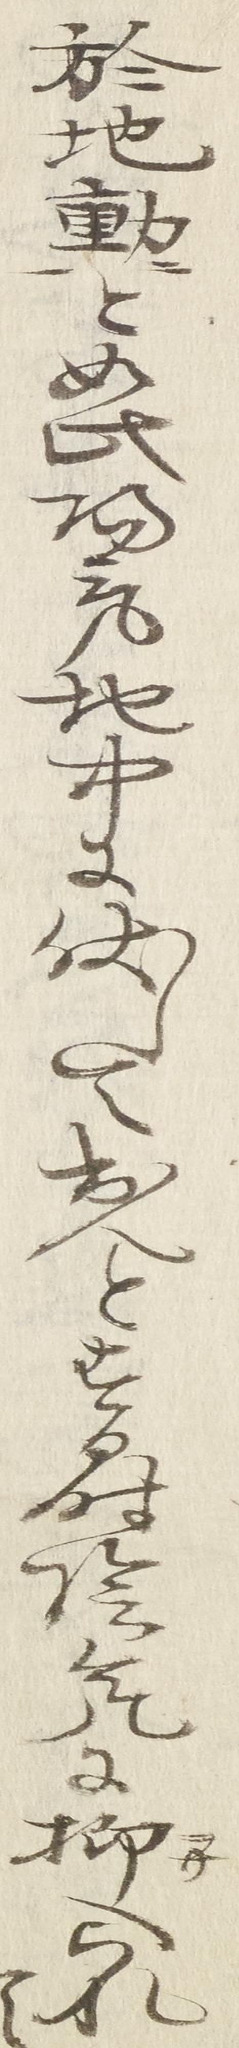於地動にと如此陽気地中に伏して出んとする時陰気に抑へられて
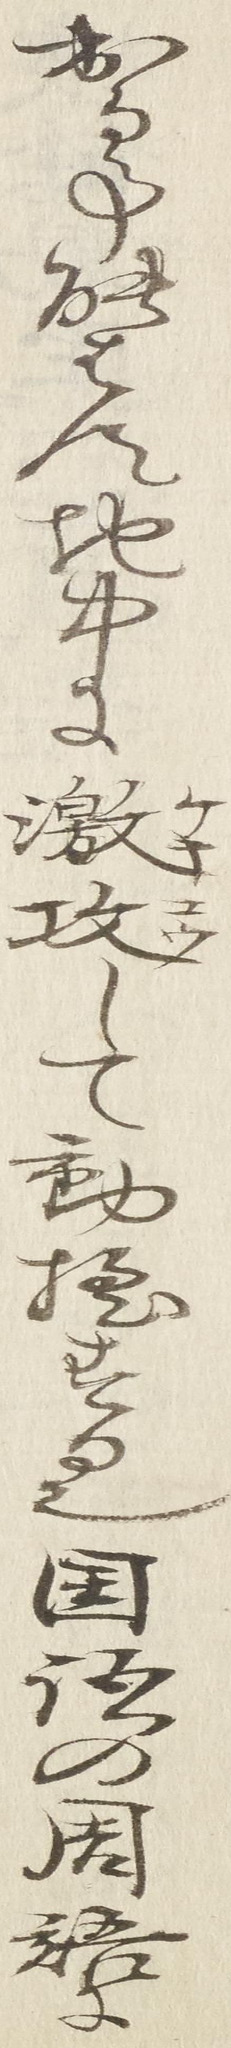出ること能はす地中に激攻して動揺する也国語の周語に
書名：地震記　下
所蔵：東京大学地震研究所図書室 Earthquake Research Institute Library, The University of Tokyo, JAPAN
